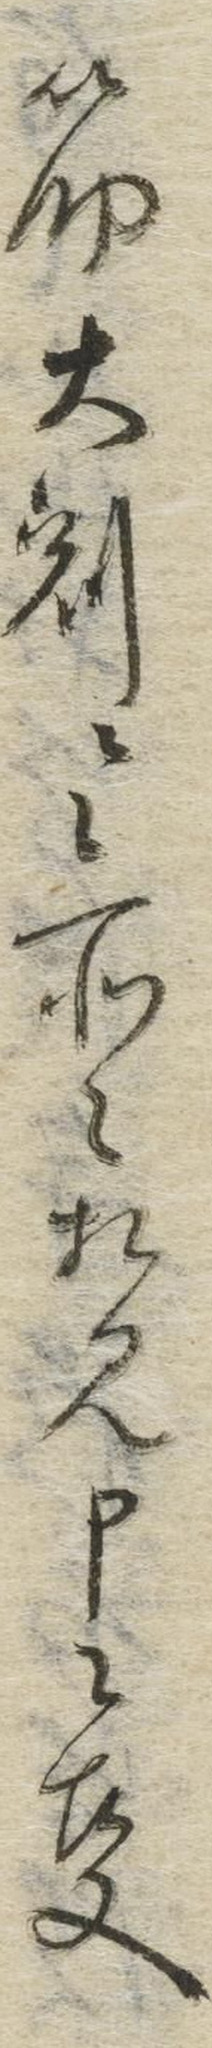筋大割二而所々相見申候事
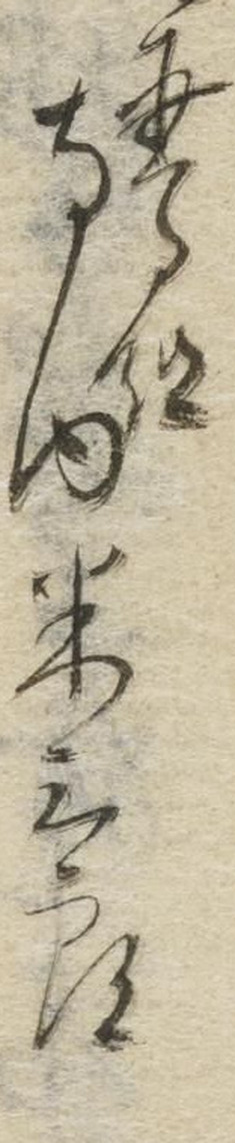寺内米三郎
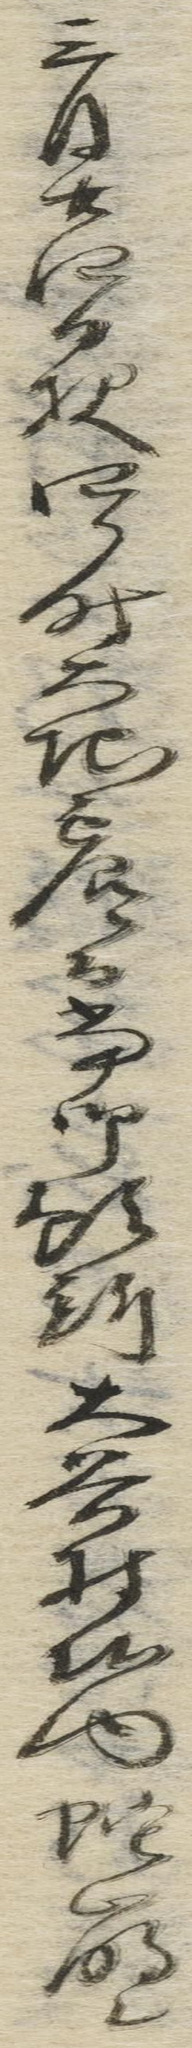三月廿四日夜四ッ時大地震二而当御預所大谷村地内陥崩レ
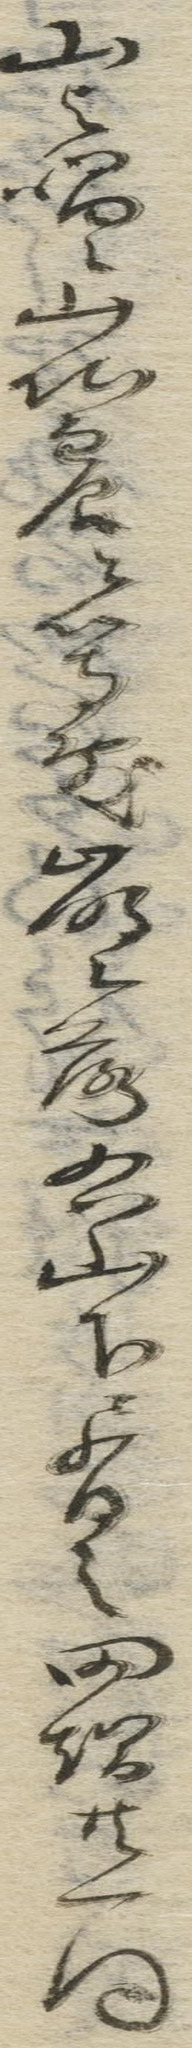山々鳴候山地震二等敷崩レ落右山下二有之田端共一同
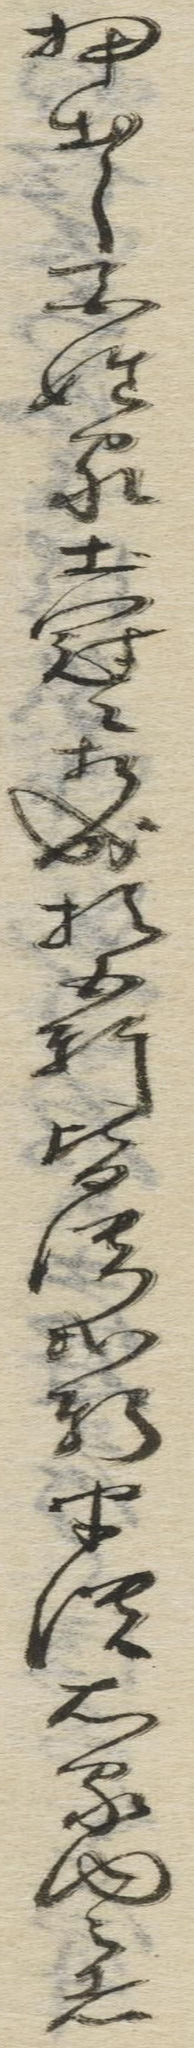押出し百姓家土冠二相成五軒皆潰弐軒半潰右家内之者
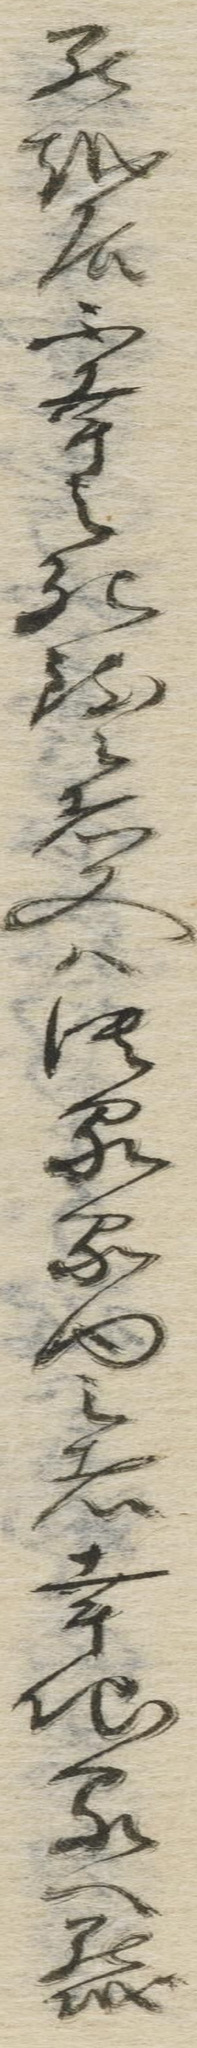罷越居不有之死致候者又ハ潰家家内之者幸他家へ罷越
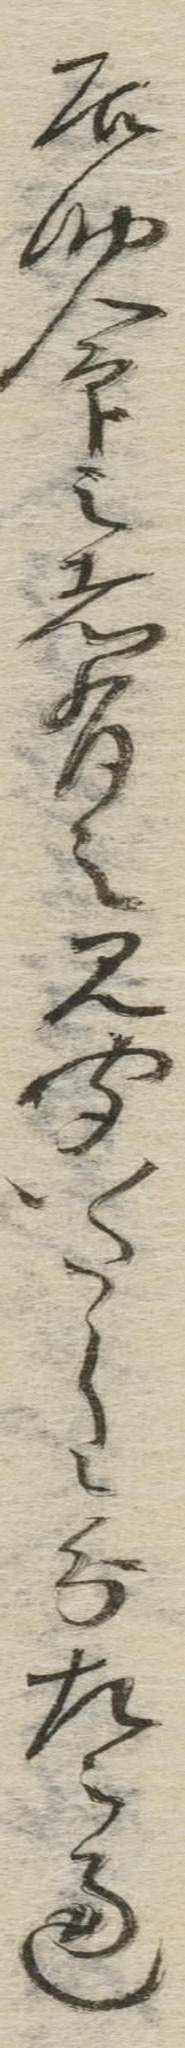居助命之者有之見聞いたし候分左之通
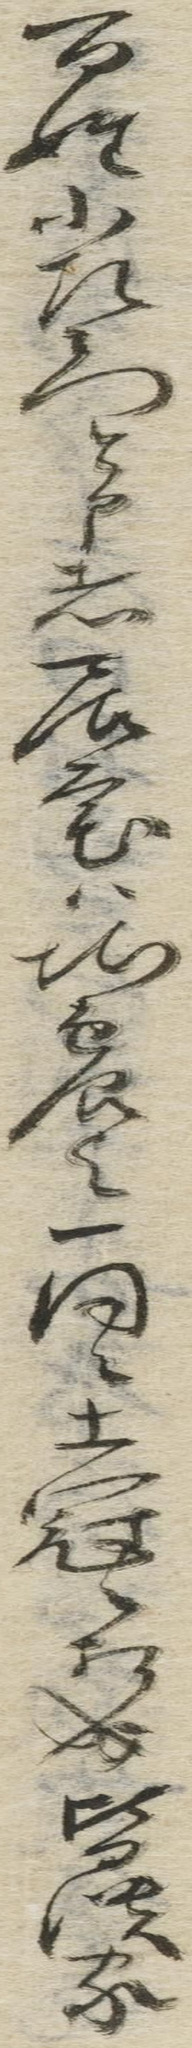一百姓小左衛門と申者居宅ハ地震二而一同二土冠二相成皆潰家
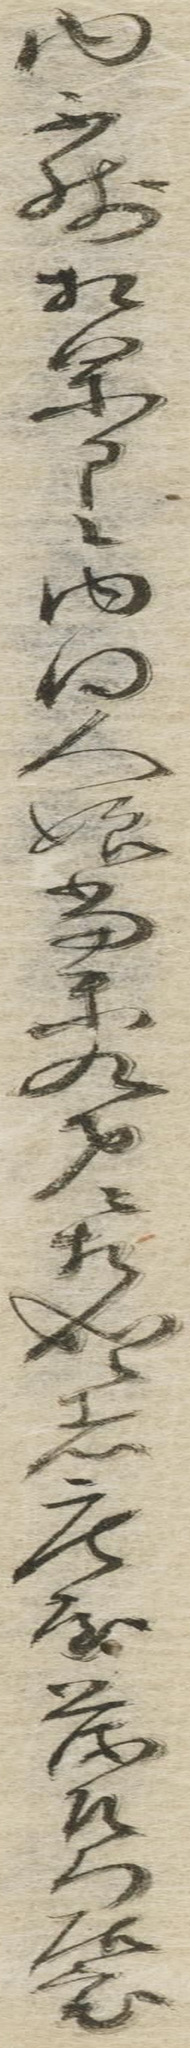内不残相果申内同人娘当未九才二相成候者庄屋茂左衛門居宅
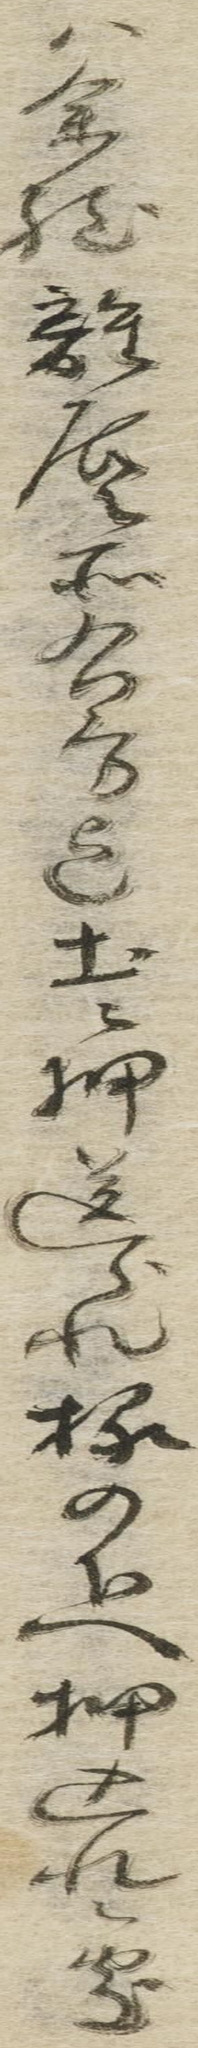ハ余程離居候所右方迄土二押送られ縁の下へ押込れ候処
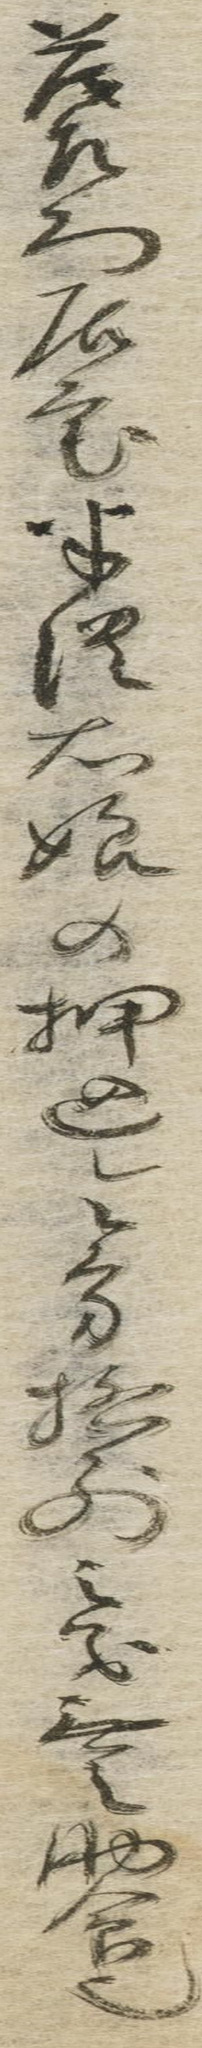茂左衛門居宅半潰右娘の押込レ候方格別の義無之助命也
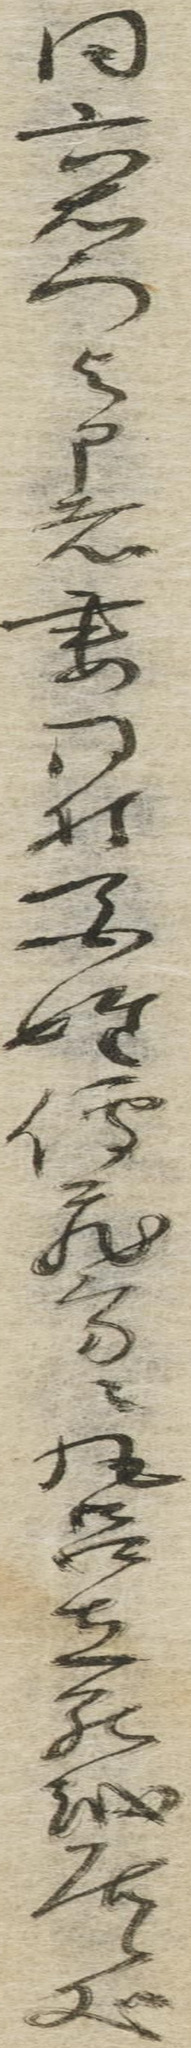一同六右衛門と申者妻同村百姓伝蔵方二風呂立罷越居候処
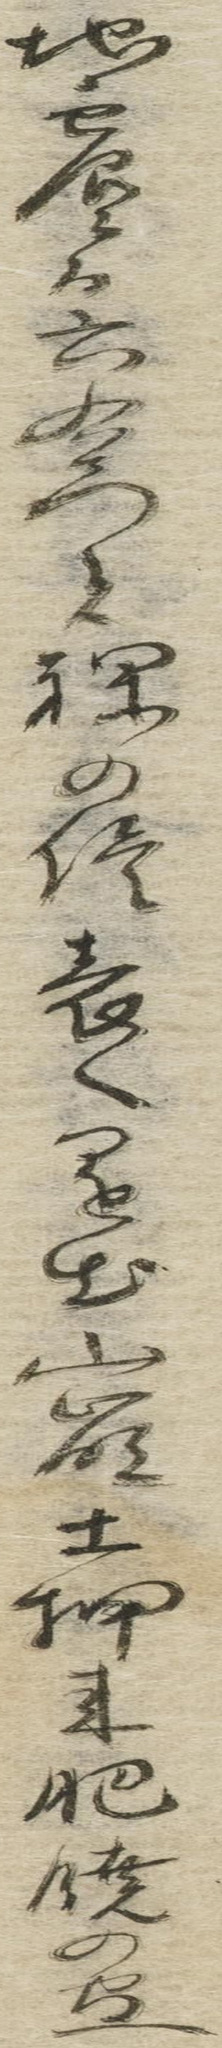地震二而六右衛門と裸の儘表へ懸出山崩土押来肥暁の守へ

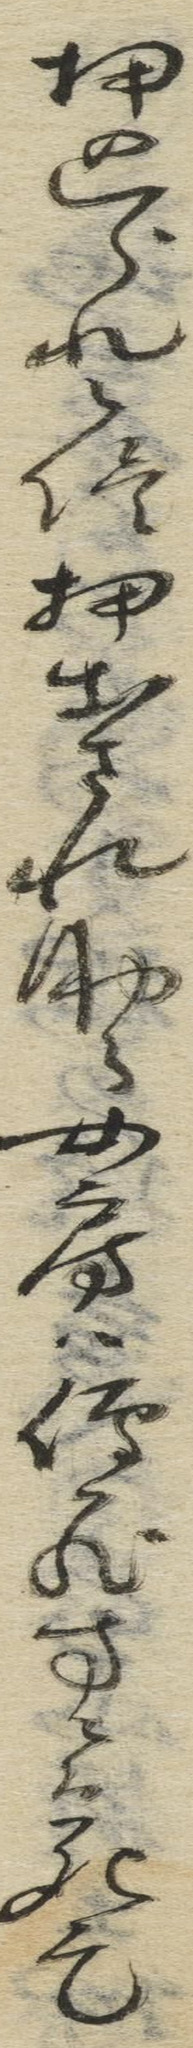押込られ候儘押出され助る女房ハ伝蔵方二而死亡
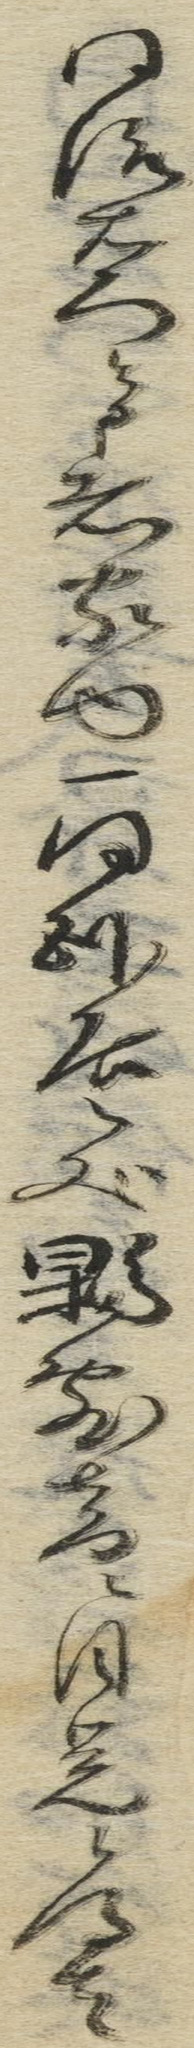一同清右衛門と申者家内一同臥居候処夥敷音二目覚候得は
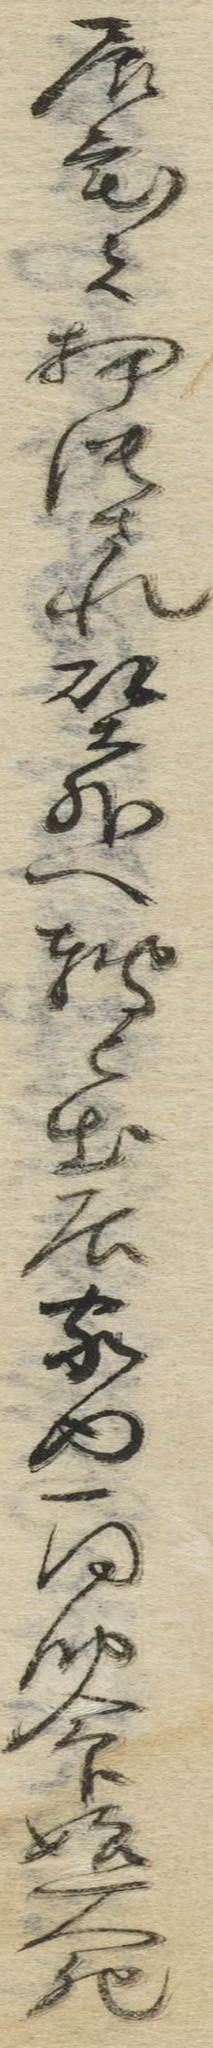居宅は押潰され壁外へ転かり出居家内一同助命娘一人死
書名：弘化丁未天變日記
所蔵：東京大学地震研究所図書室 Earthquake Research Institute Library, The University of Tokyo, JAPAN
